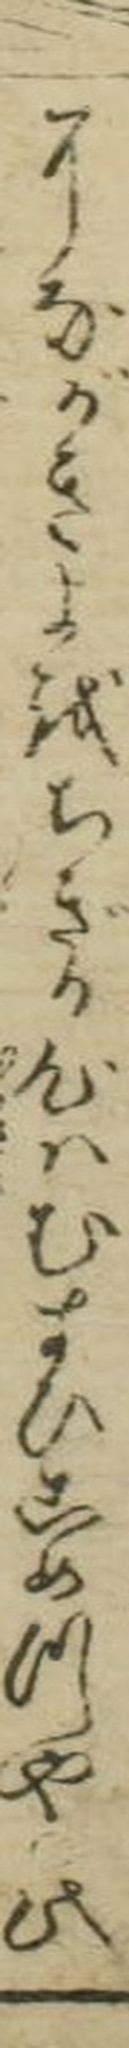にながきよをちぎる心はむすひこめつや○此
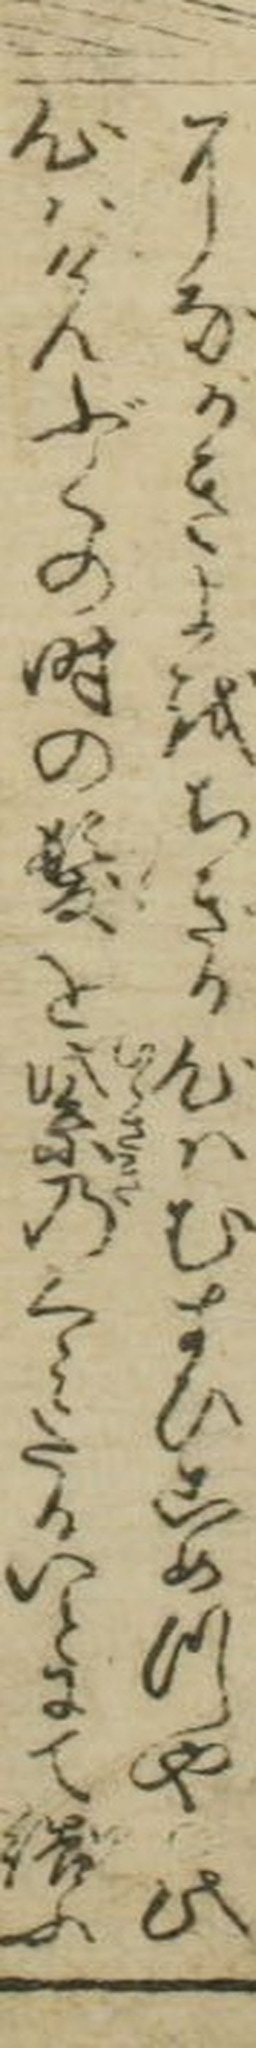心はけんぶくの時の髪を紫のくみたるいとにて結ふ
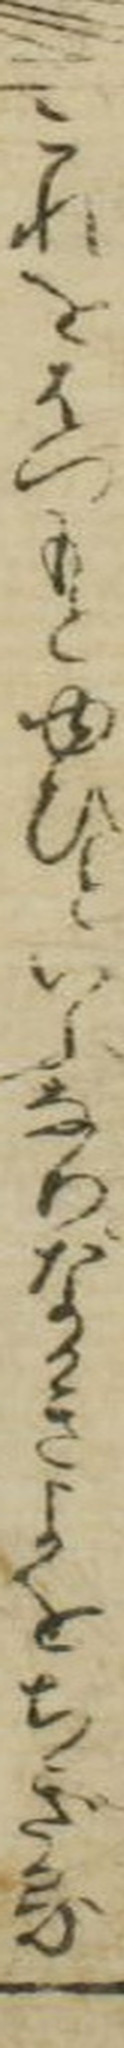これをはつもとゆひといふなり。なかきよをちぎる
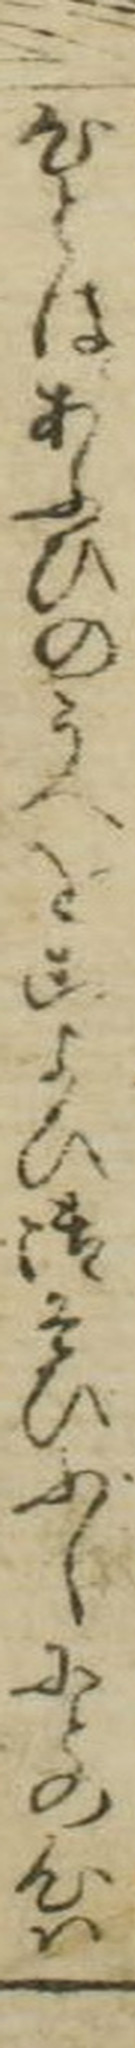心とはあふひのうへをこよひ御そひぶしにとの心は
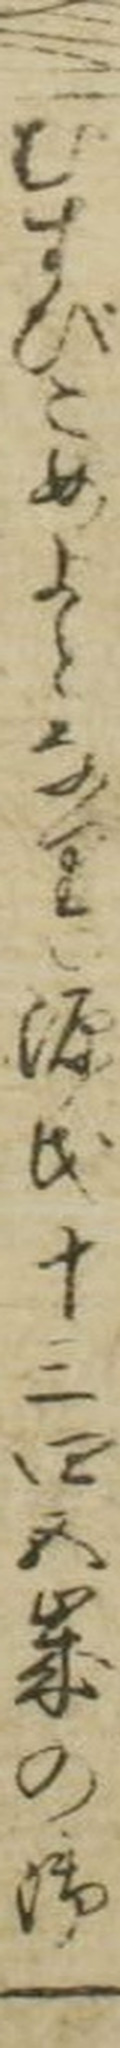むすびこめよとなり○源氏十三四五歳の御
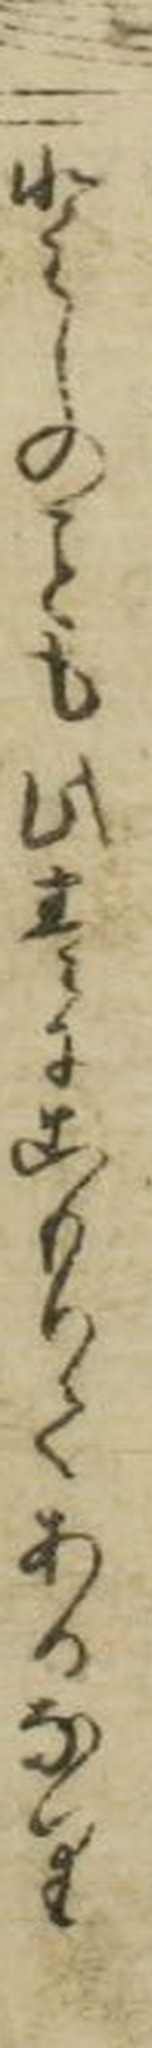としのことも此巻にこもりてあるなり
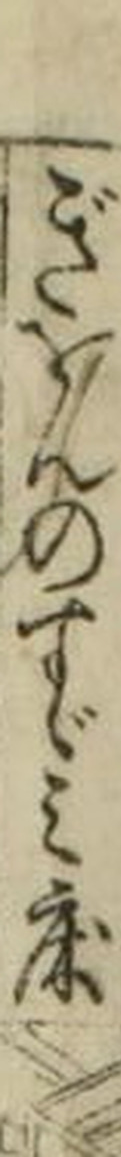ぎをんのすゞみ床
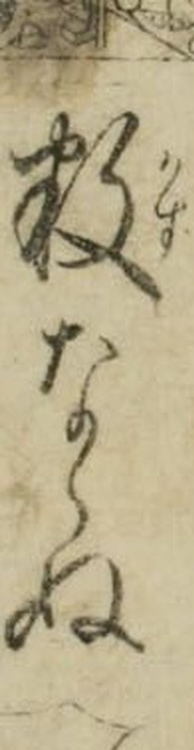数ならぬ
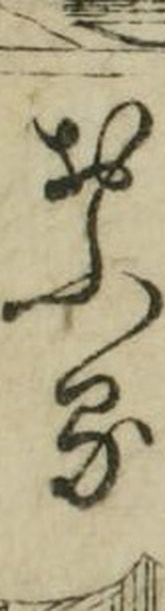おふる
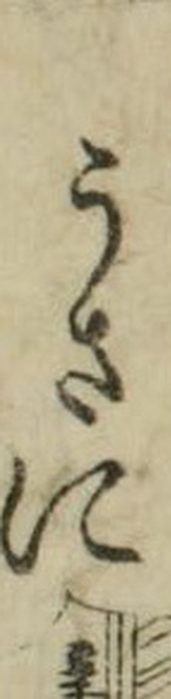うさに
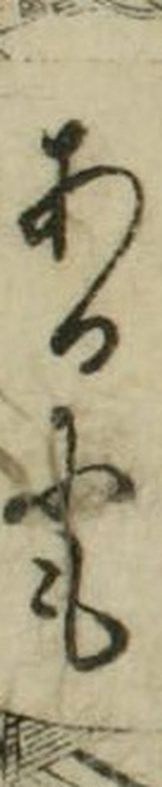あるにも
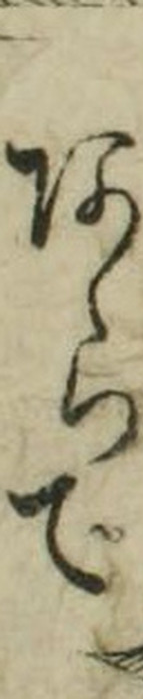あらで
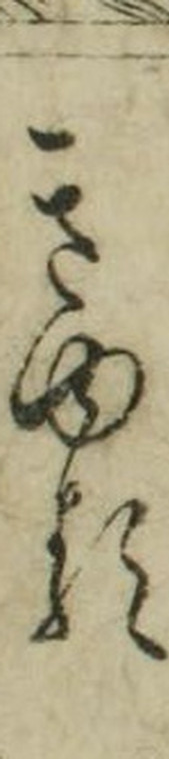きゆる
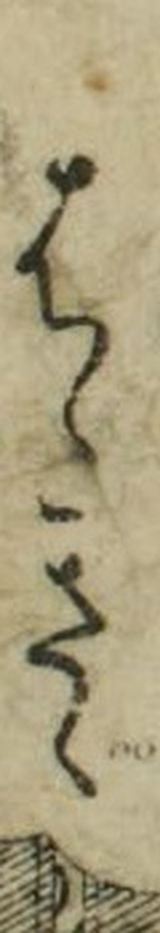はゝきゞ

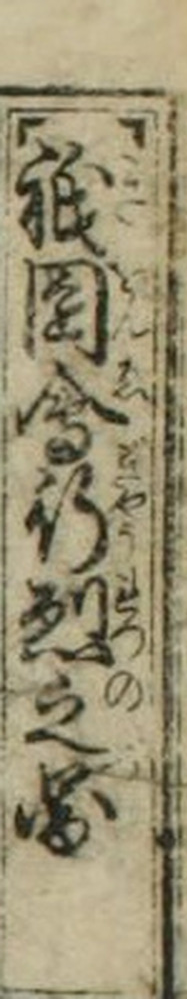祇園會行烈之図
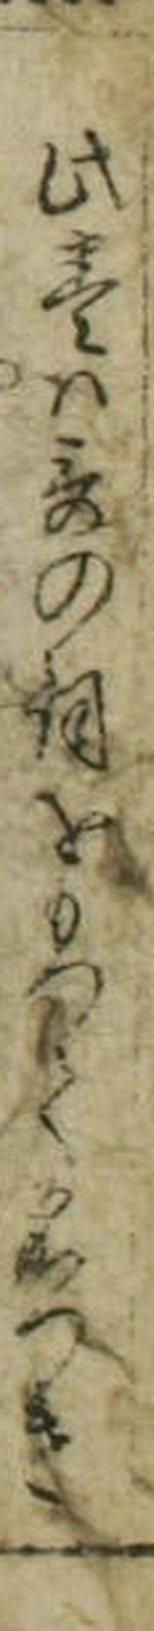此巻は哥の詞をもつて名つけ
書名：女源氏教訓鑑
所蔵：東京学芸大学附属図書館
